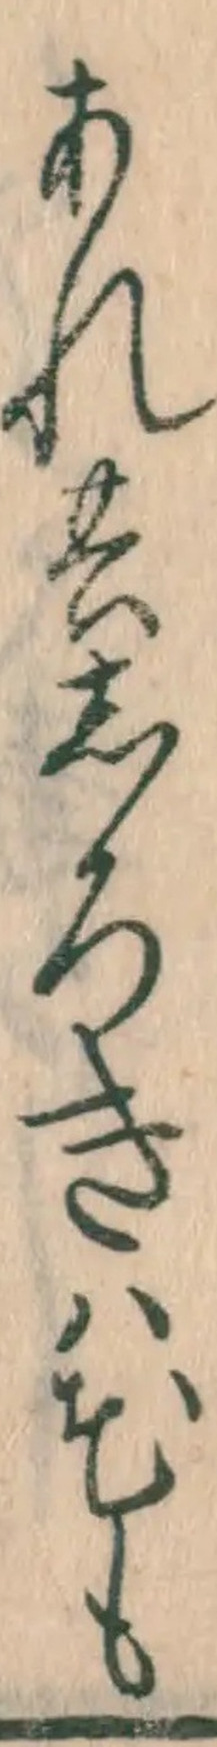あれ共しろきは花も
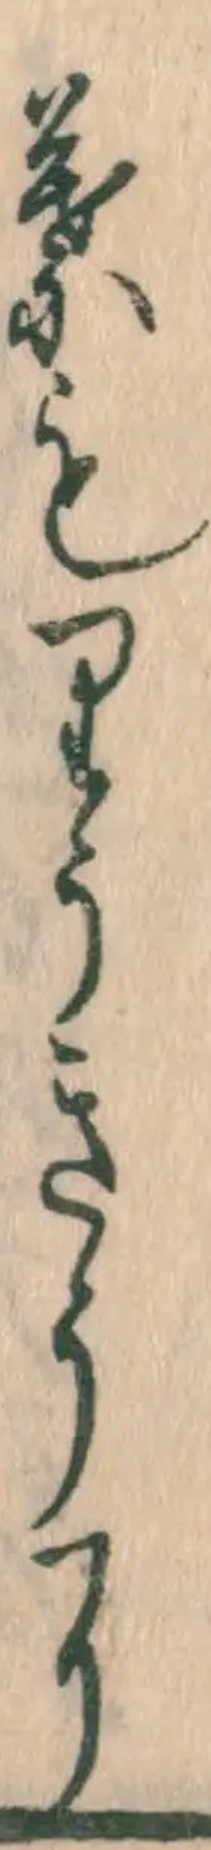葉もりうきうに
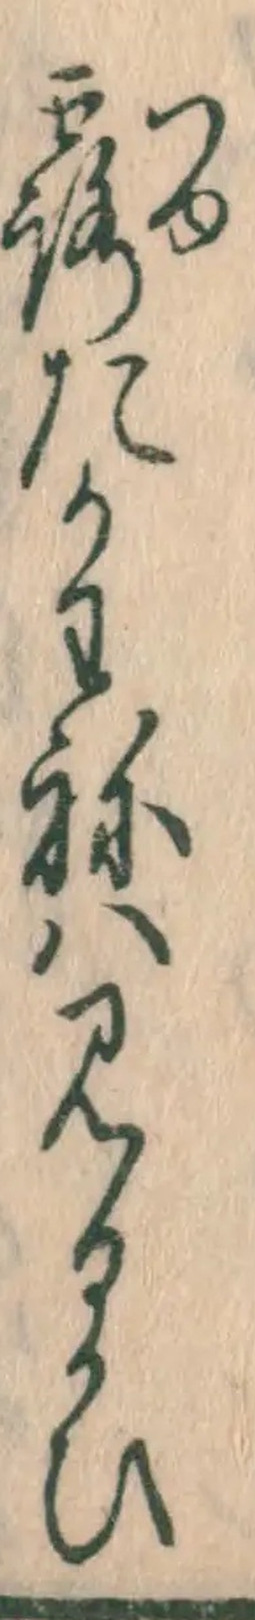露たかはねは見るかひ
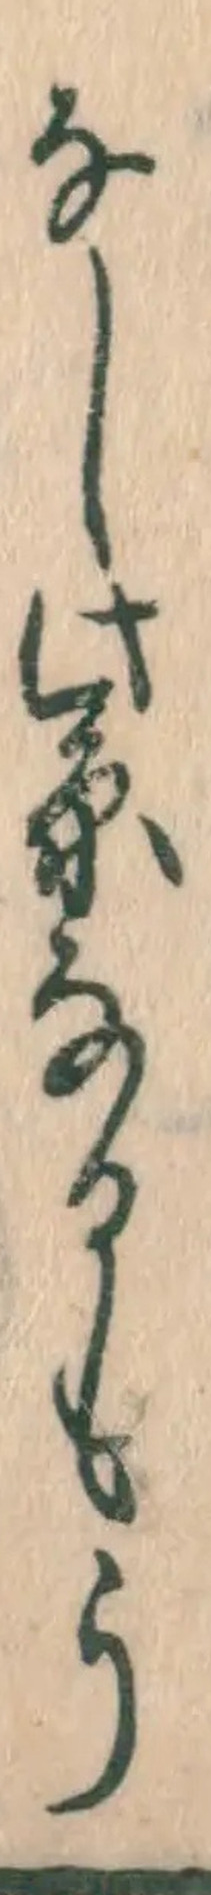なし紫なるもう
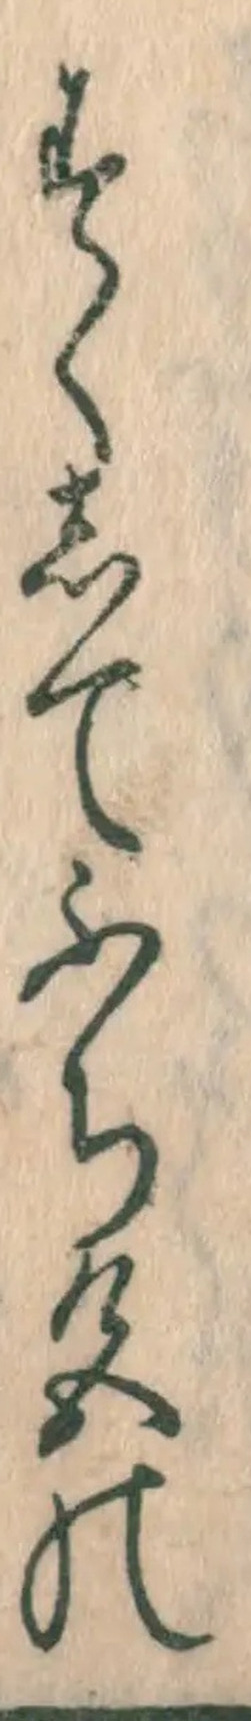すくしてふち色の
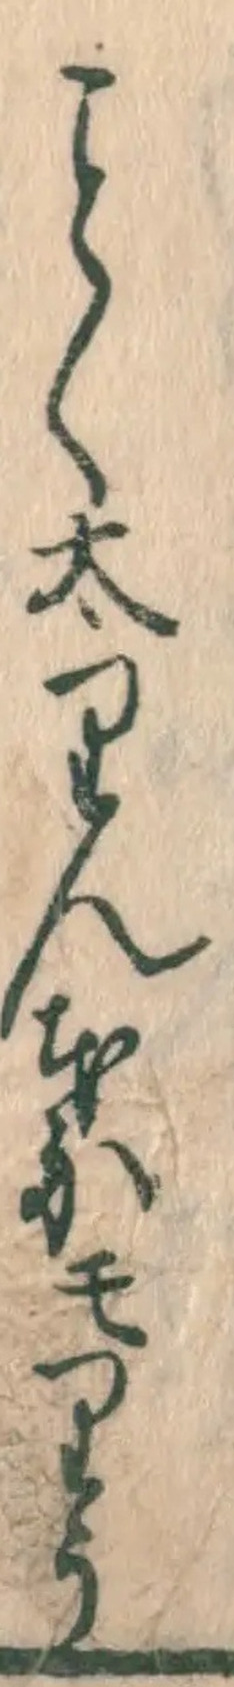ことく太りん紫もりう
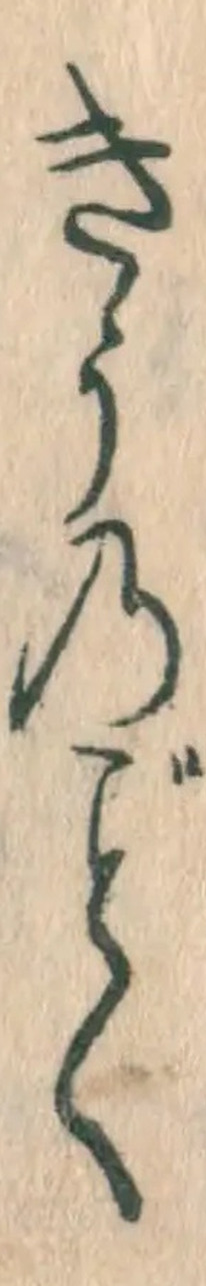きうのごとく
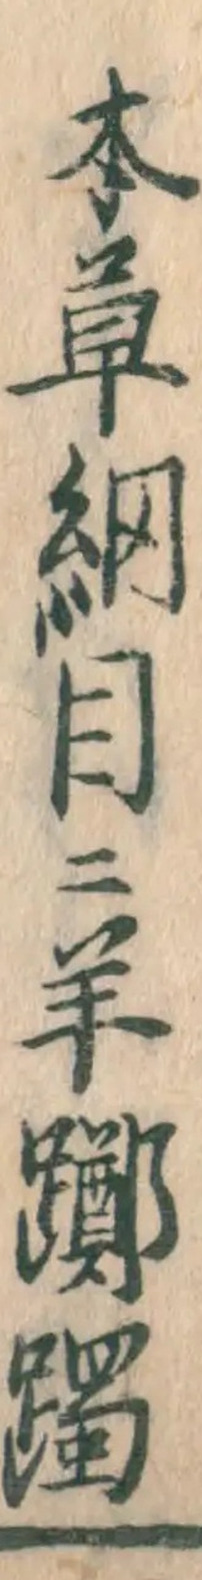本草網目に羊躑躅

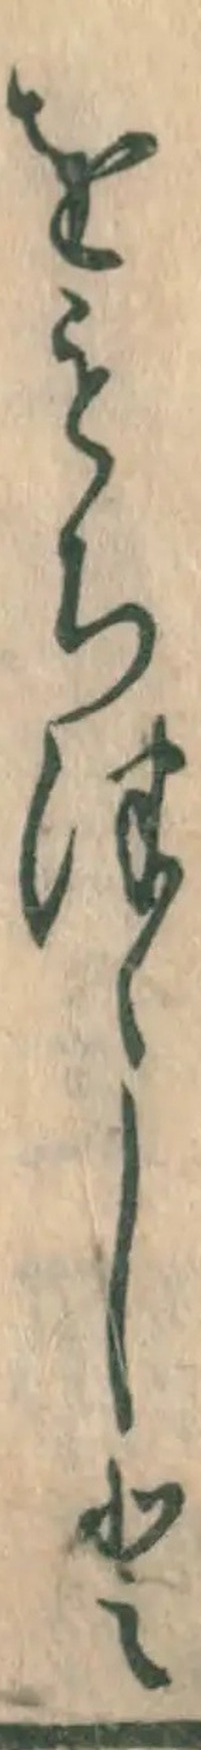をもちつゝしと
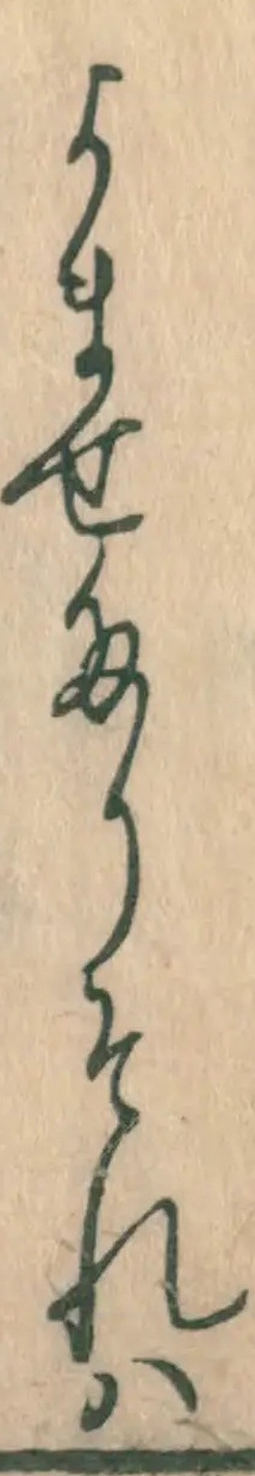よませたりそれは
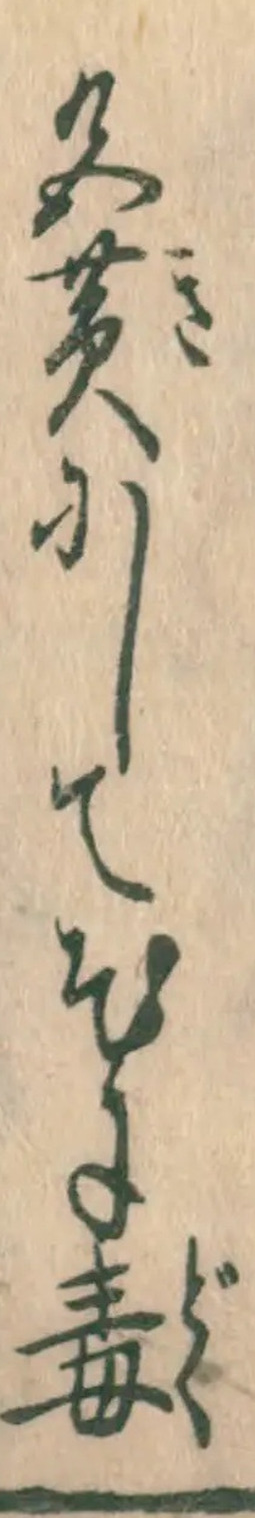色黄にして花に毒
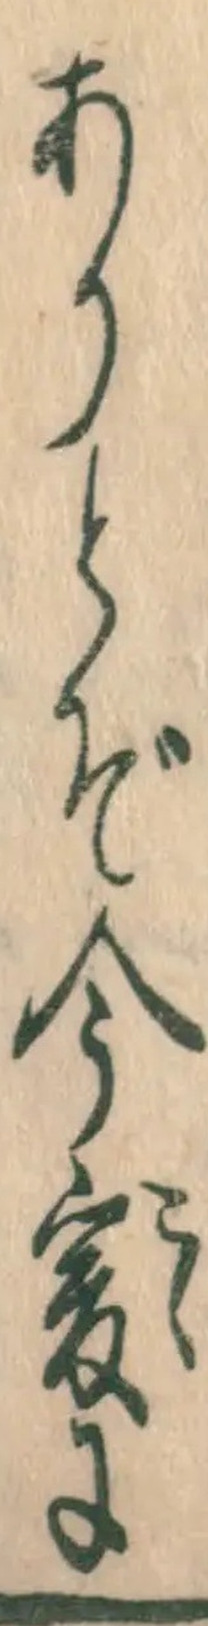ありとぞ今爰に
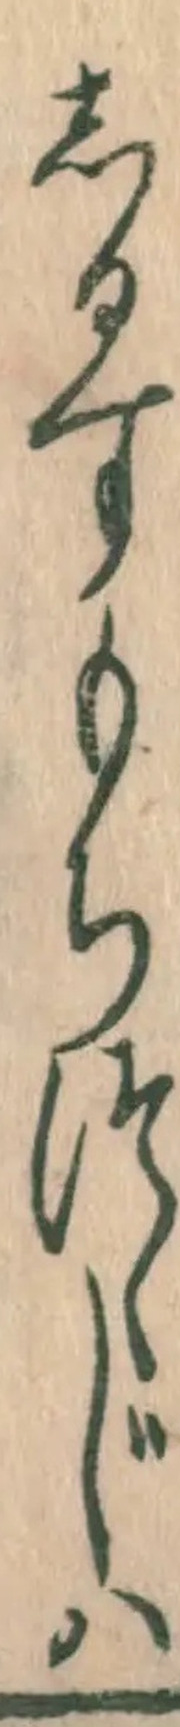しるすもちつゝじは
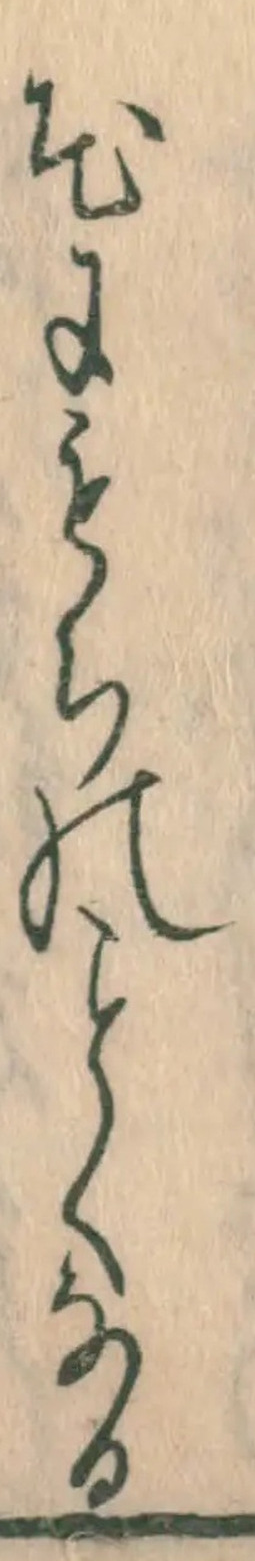花にもちのことくなる
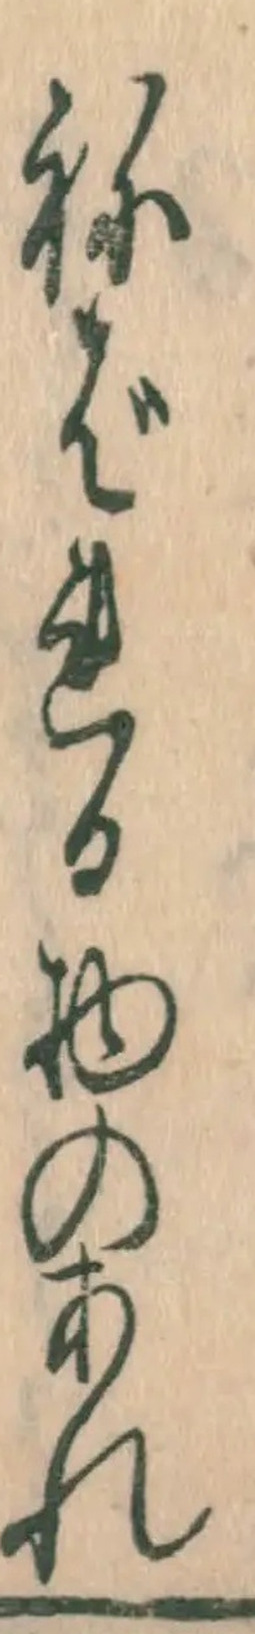ねばれる物のあれ
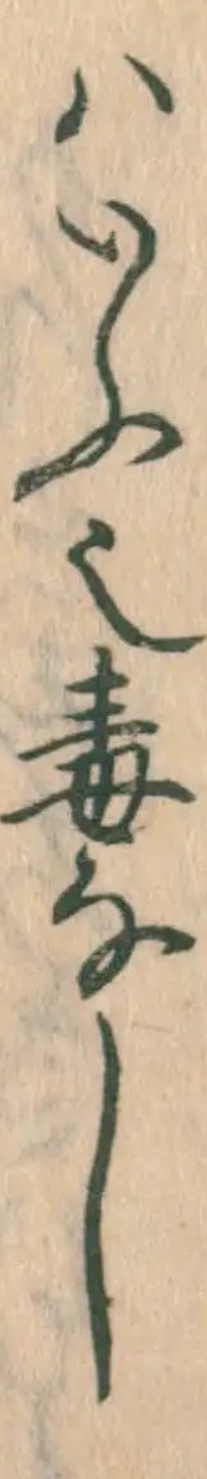はいふ也毒なし
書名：錦繍枕 5巻. [2]
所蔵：国立国会図書館 National Diet Library, JAPAN
